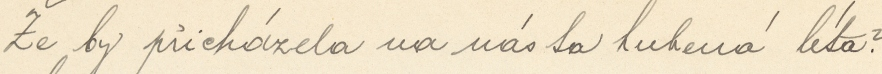Že by přicházela na nás ta hubená léta?
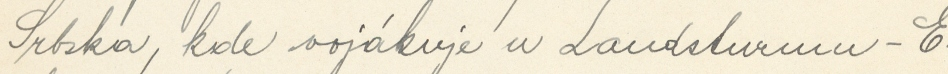Srbska, kde vojákuje u Landsturmu - E-
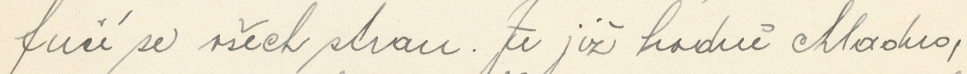fučí se všech stran. Je již hodně chladno,
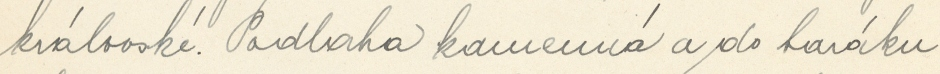královské. Podlaha kamenná a do baráku
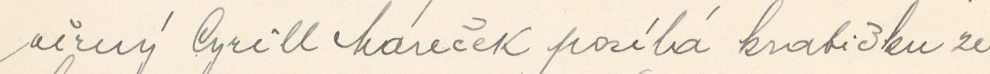věrný Cyrill Mareček posílá krabičku ze
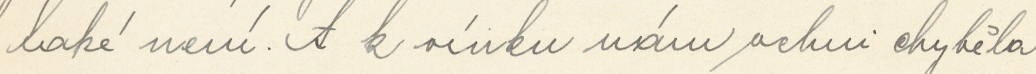také není. A k vínku nám velmi chyběla
